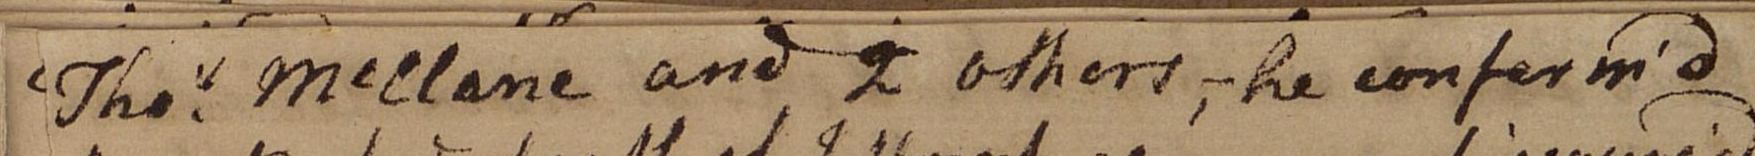Tho^s. M^c Clane and 2 others,- he conferm'd
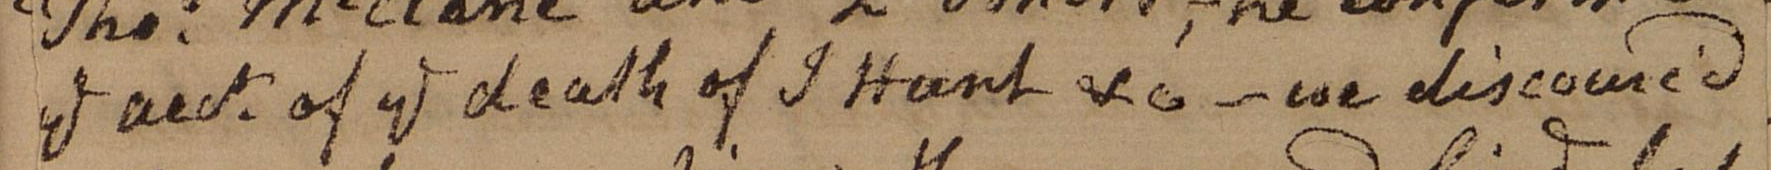y^e acc^t. of y^e death of J Hunt &c- we discoure'd
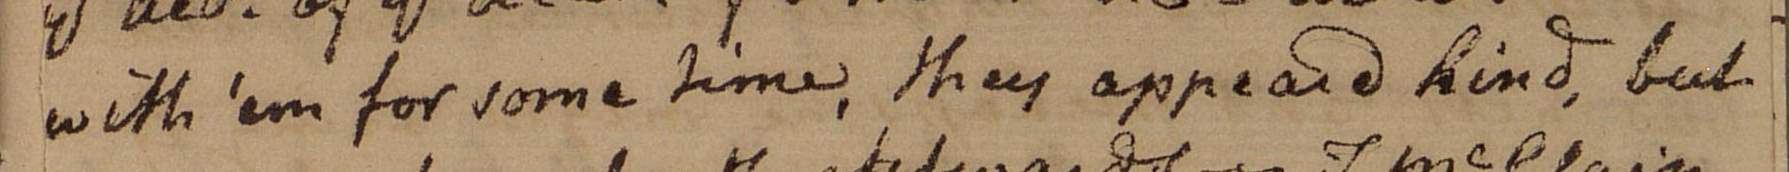with 'em for some time, they appeard kind, but
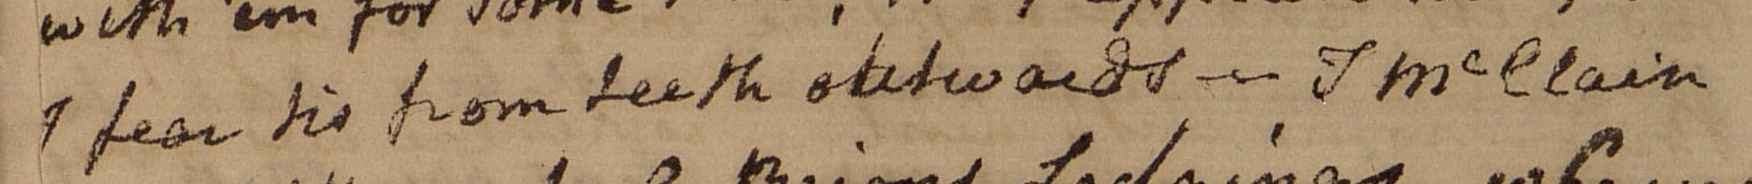I fear tis from teeth outwards- T M^c Clain
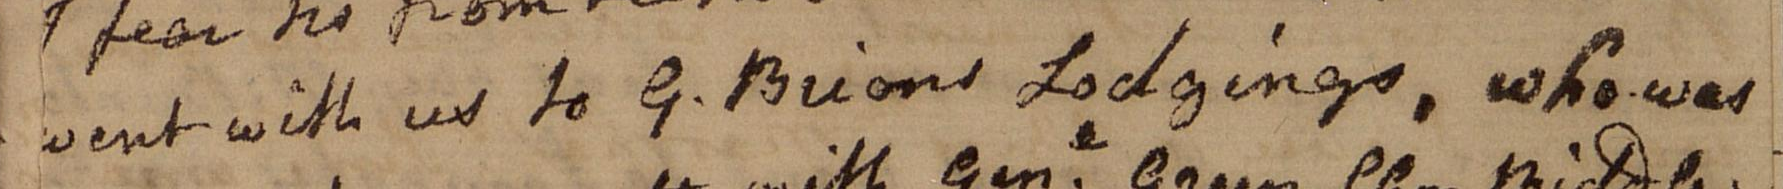sent with us to G. Brions Lodgings, who was
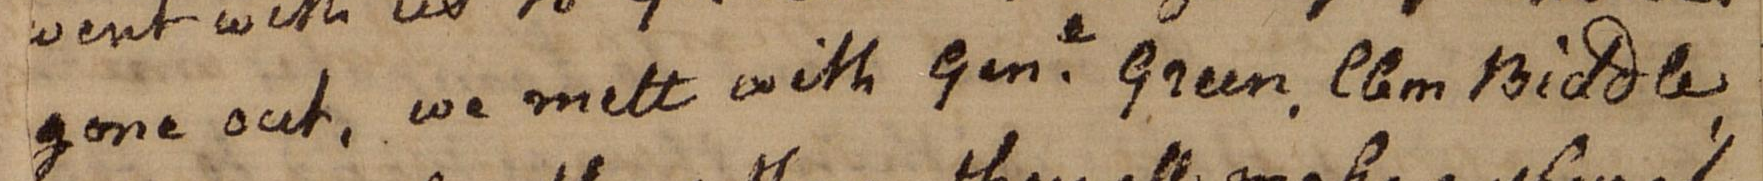gone out, we mett with Gen^l. Green, Clem Biddle,
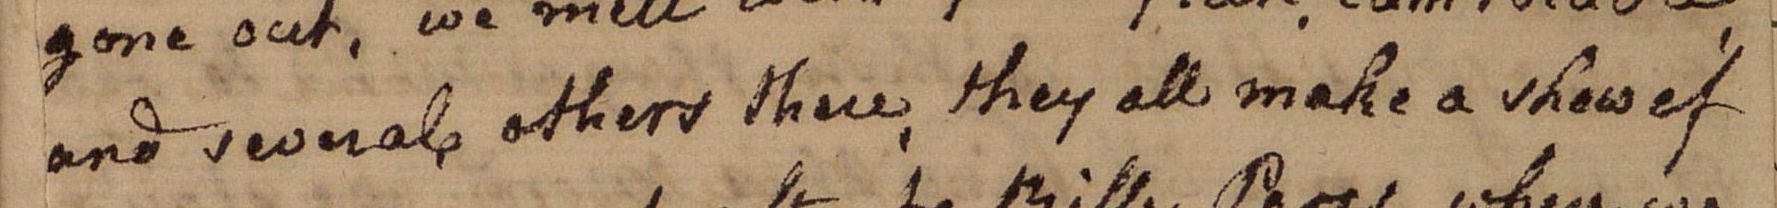and several others there, they all make a show of
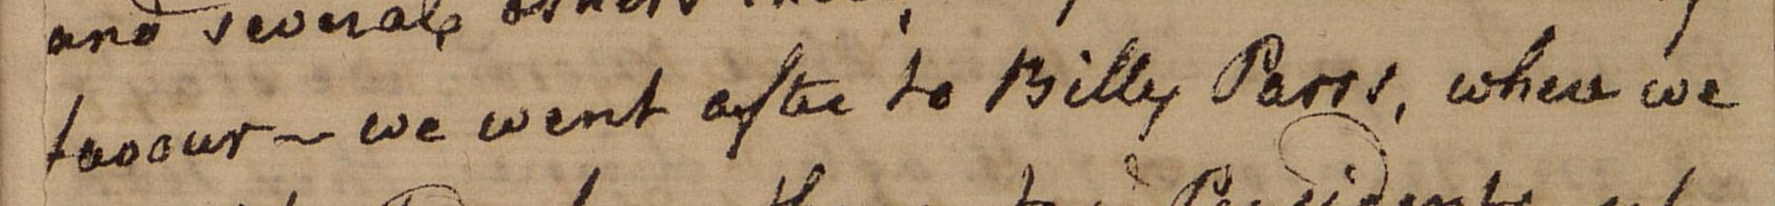favour- we went after to Billy Parrs, where we
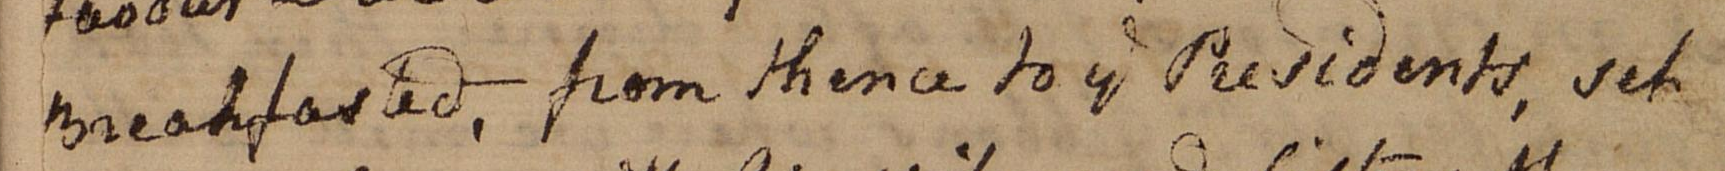Breakfasted,- from thence to y^e Presidents, set
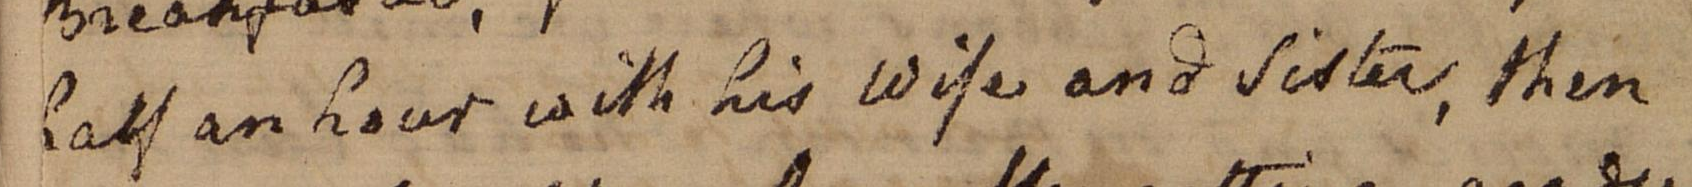half an hour with his wife and sister, then
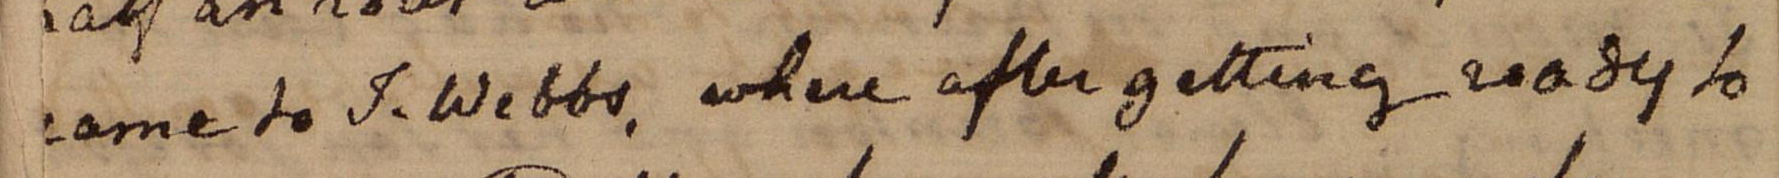came to T. Webbs, where after getting ready to
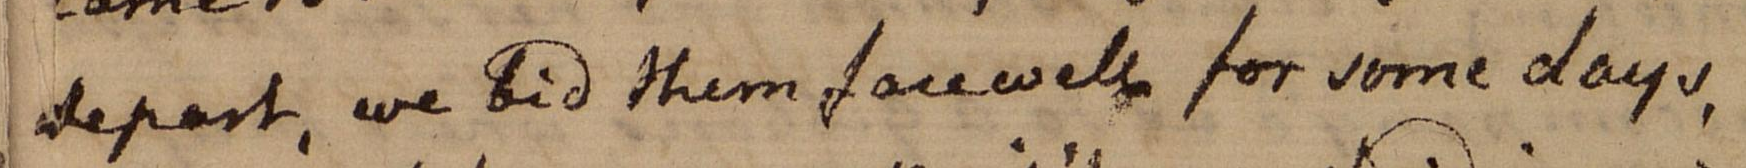depart, we bid them farewell for some days,
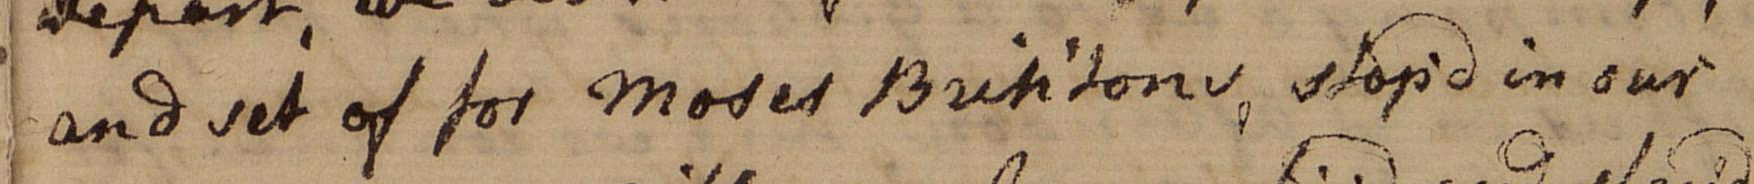and set of for Moses Brisitons, stop'd in our
